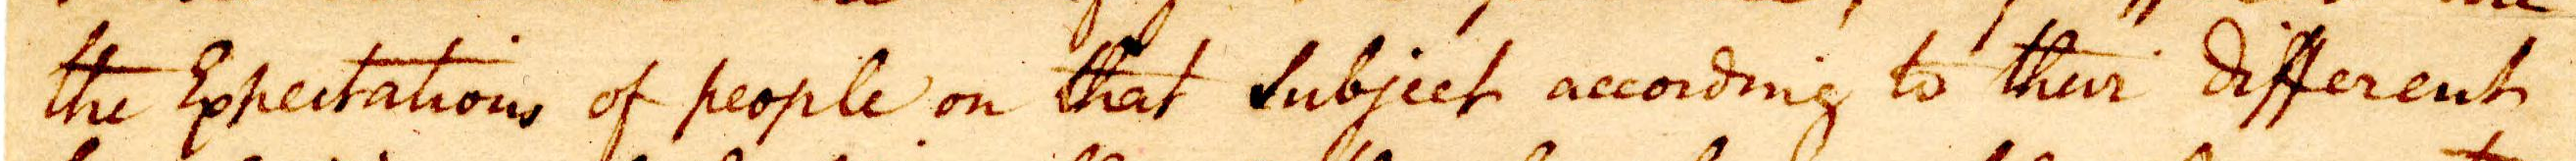the Expectations of people on that subject according to their different
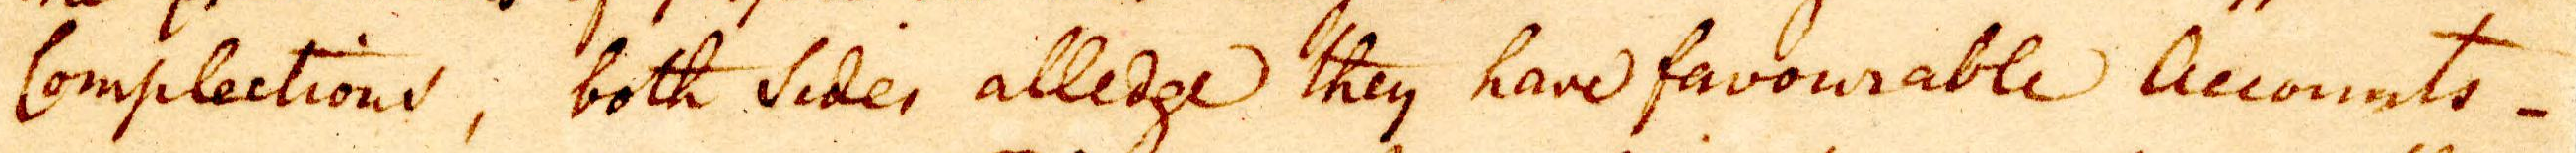Complections, both sides alledge they have favourable Accounts-
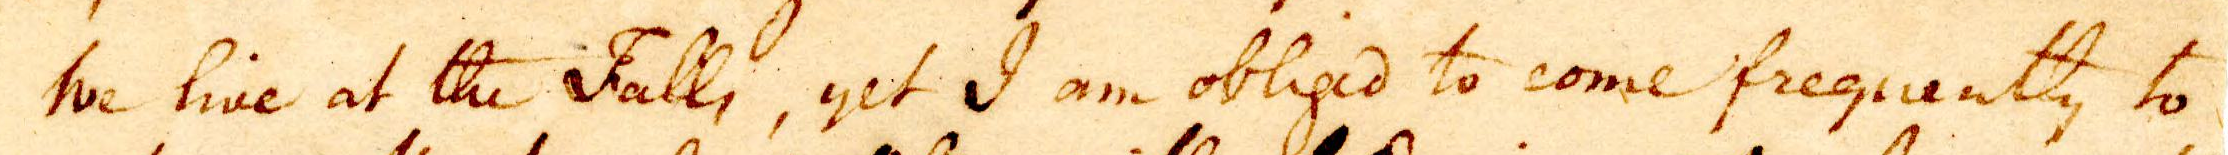We live at the Falls, yet I am obliged to come frequently to
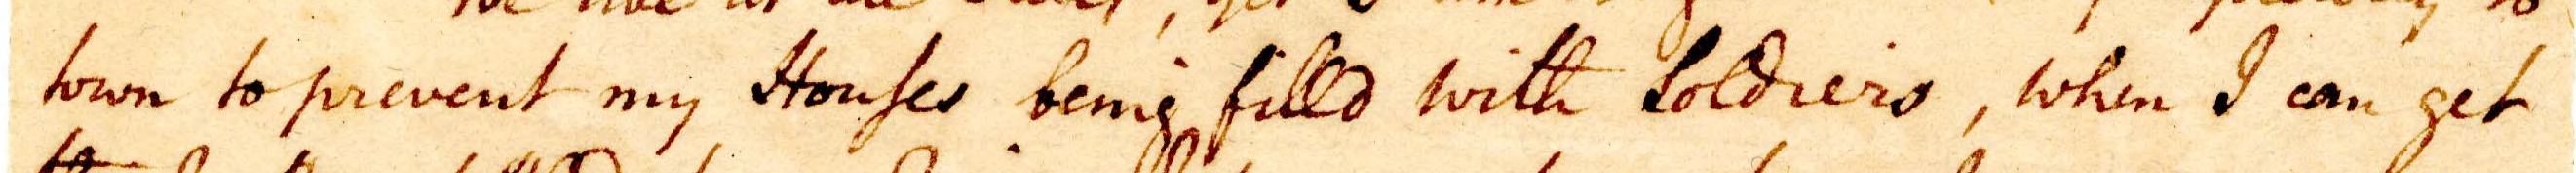town to prevent my Houses being filld with Soldiers, when I can get
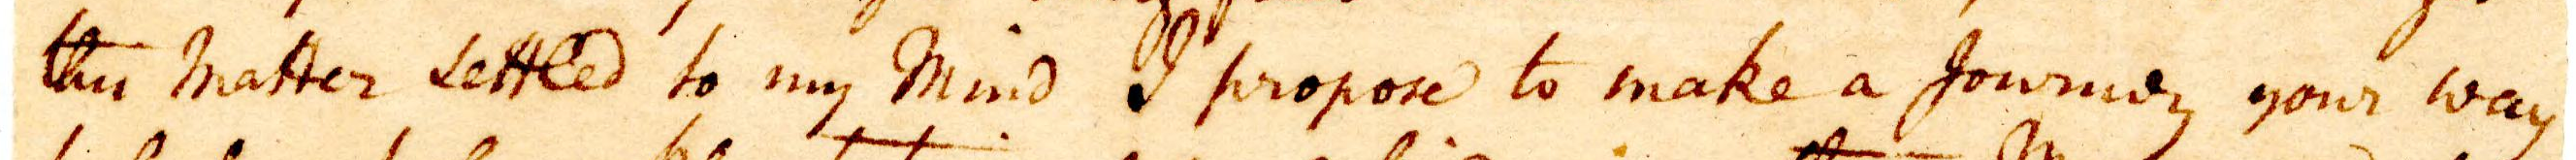this matter settled to my mind I propose to make a Journey your way
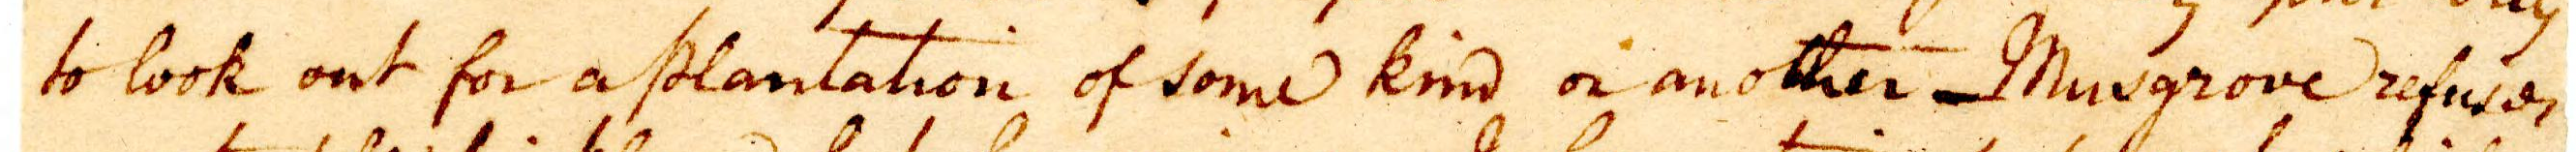to look out for a Plantation of some kind or another- Musgrove refuses
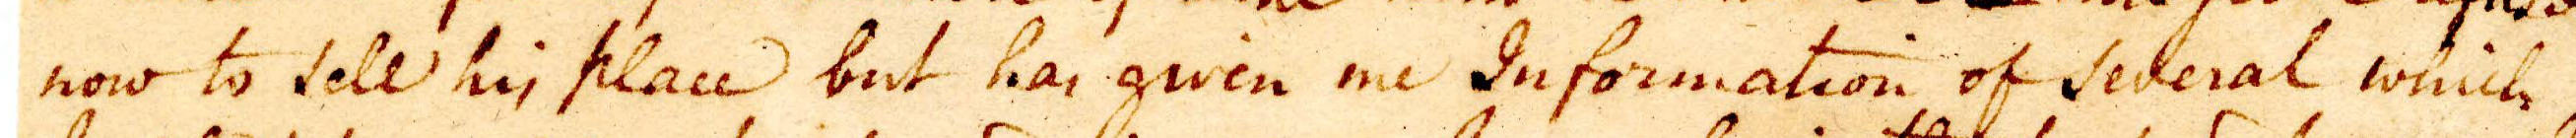now to sell his place but has given me Information of several which
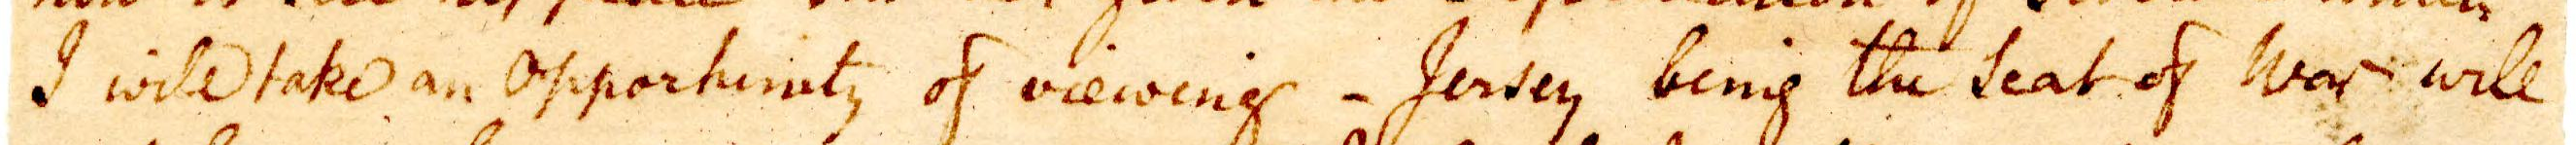I will take an opportunity of viewing- Jersey being the Seat of War will
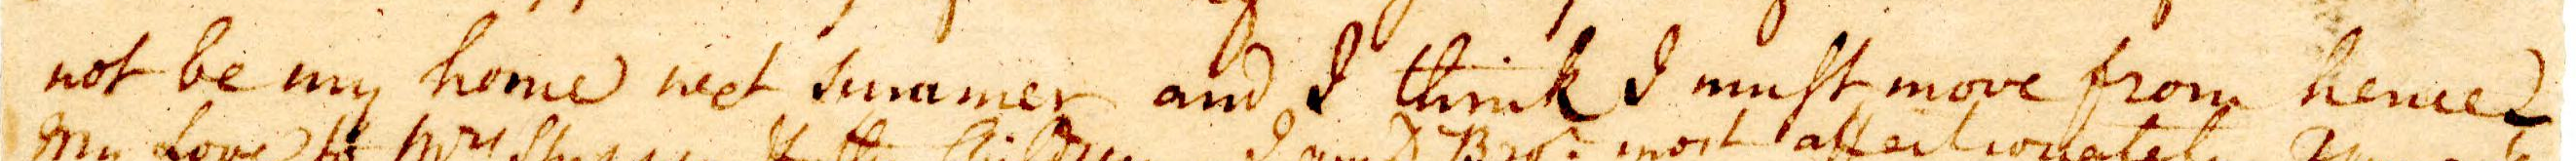not be my home next summer and I think I must move from hence-
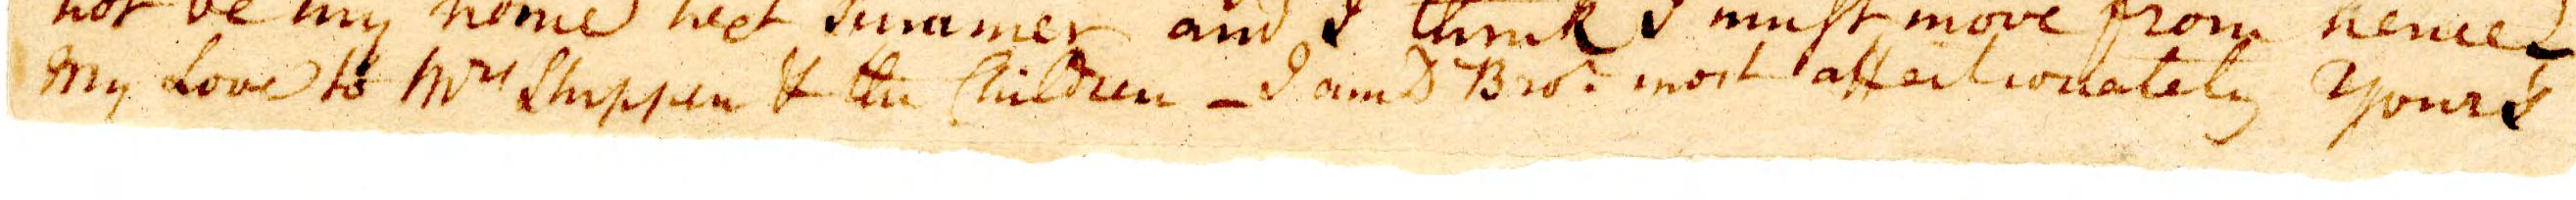My love to M^rs Shippen & the Children- I am D Bro^r. most affectionately Your's
